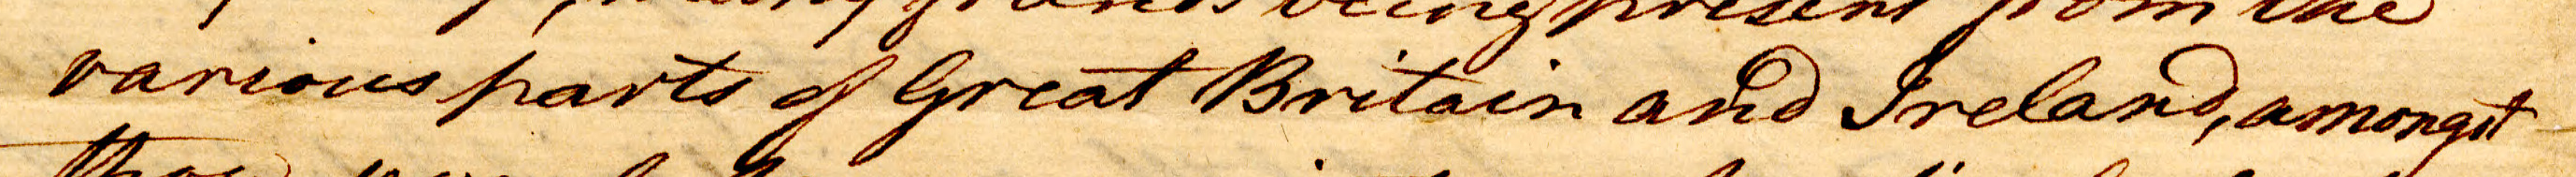various parts of Great Britain and Ireland, amongst
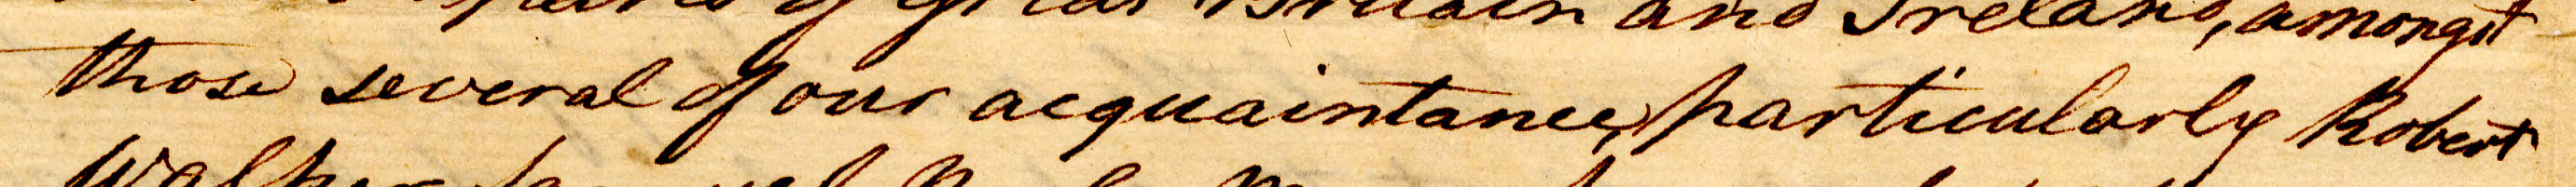those several of our acquaintance, particularly Robert
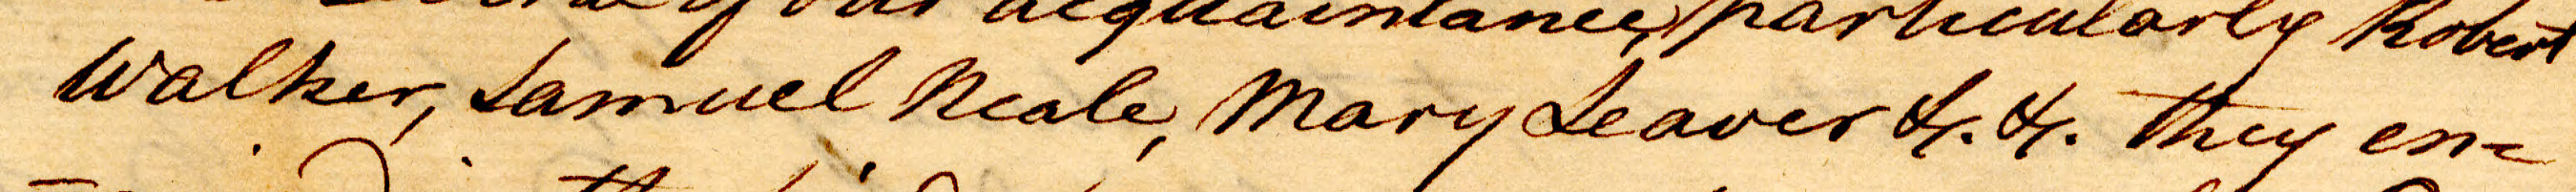Walker, Samuel Neale, Mary Leaver &c. &c. they en-
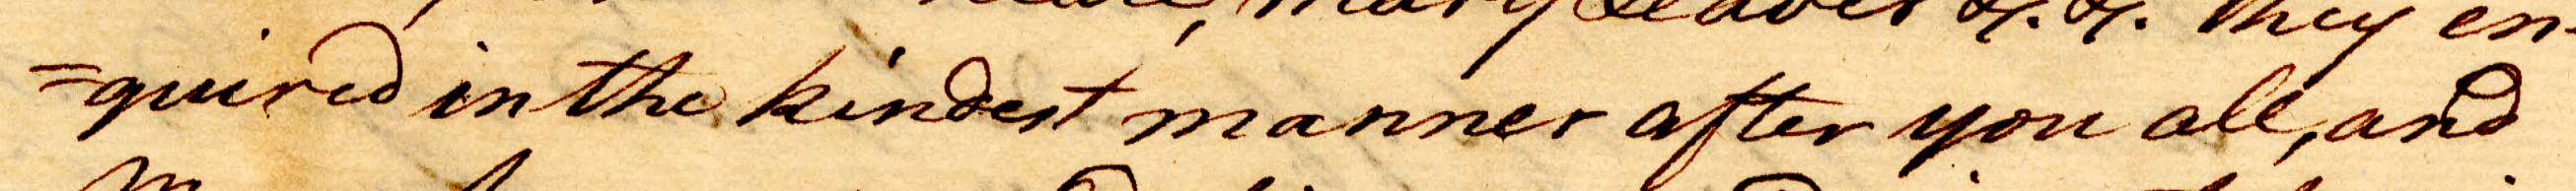-quired in the kindest manner after you all, and
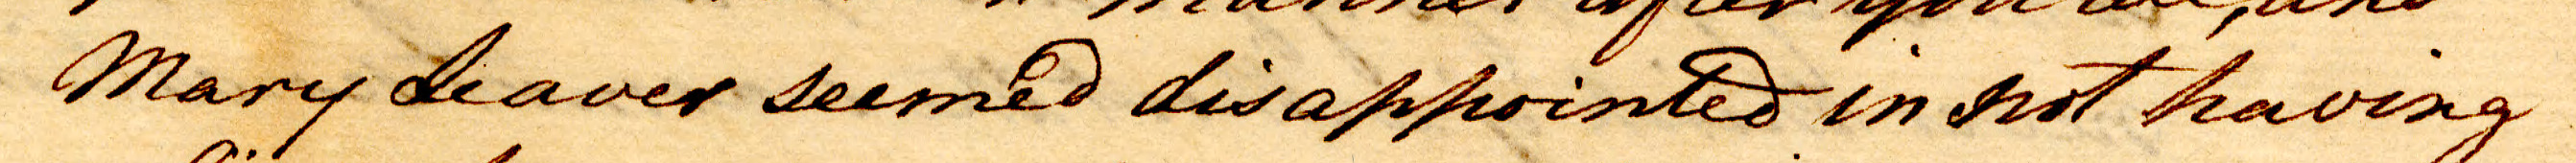Mary Leaver seemed disappointed in not having
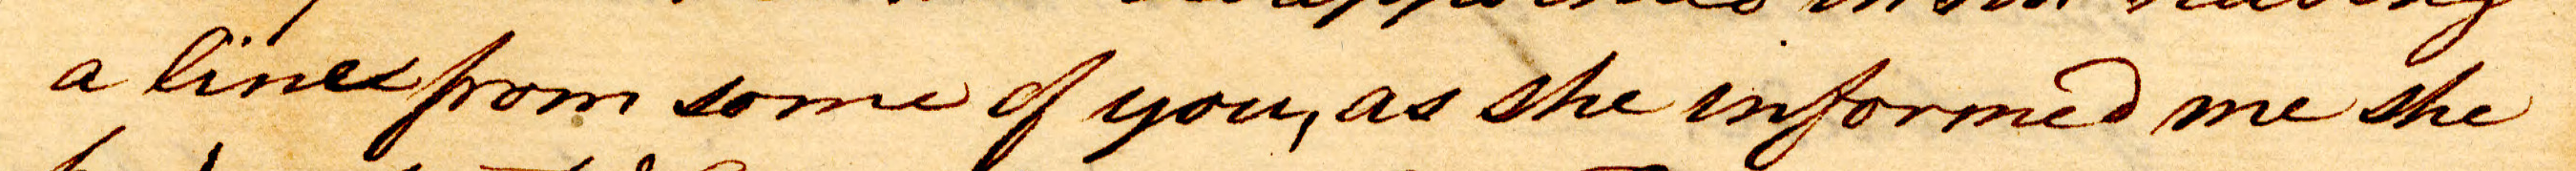a line from some of you, as she informed me she
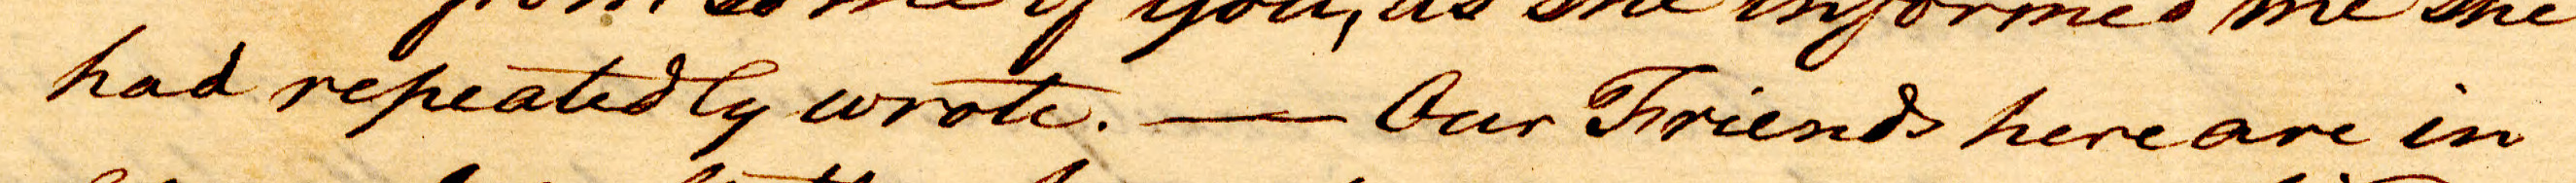had repeatedly wrote.- Our Friends here are in
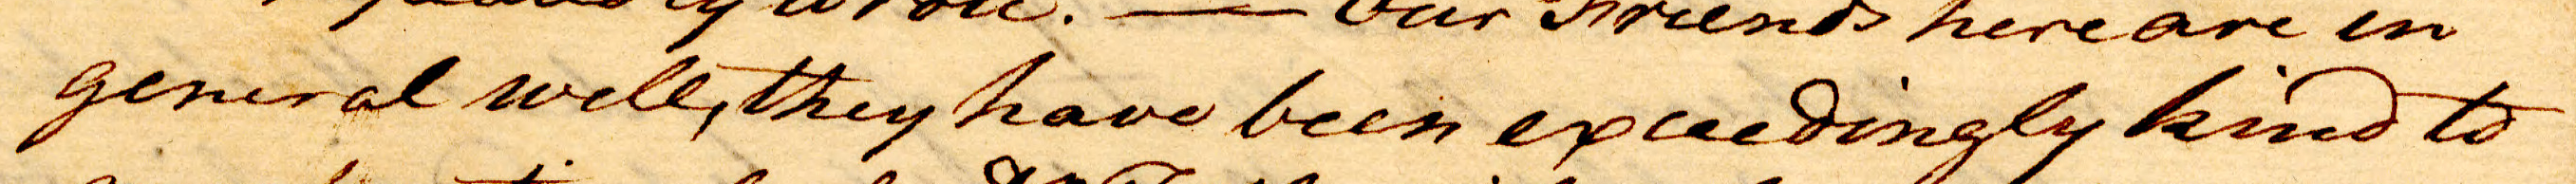general well, they have been exceedingly kind to
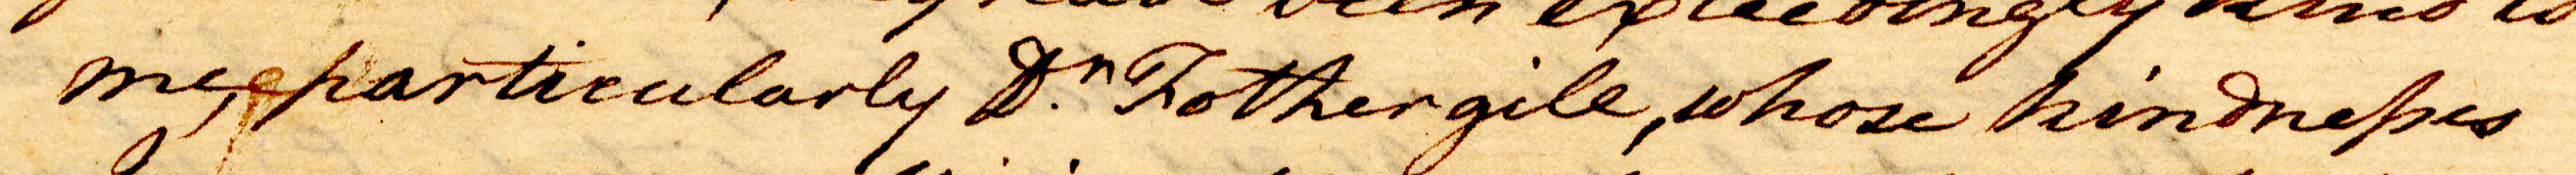me, particularly D^r. Fothergill, whose kindness
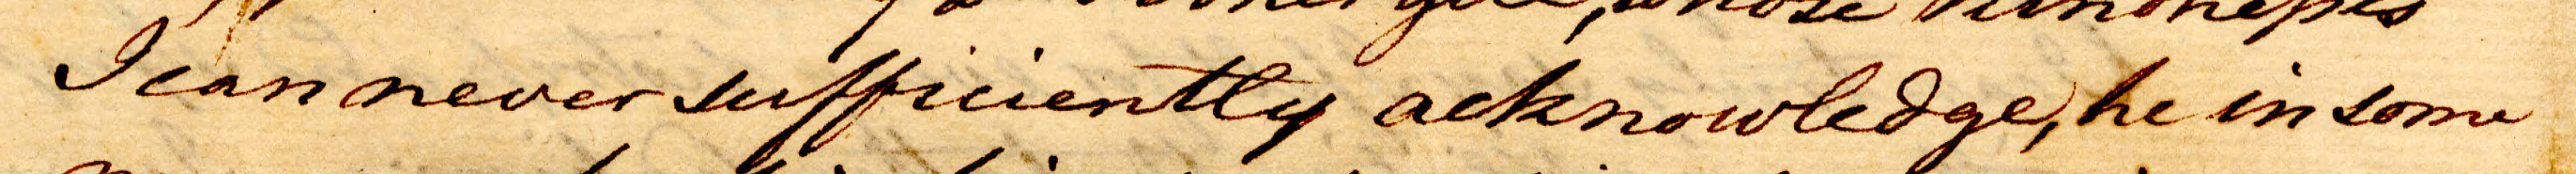I can never sufficiently acknowledge, he in some
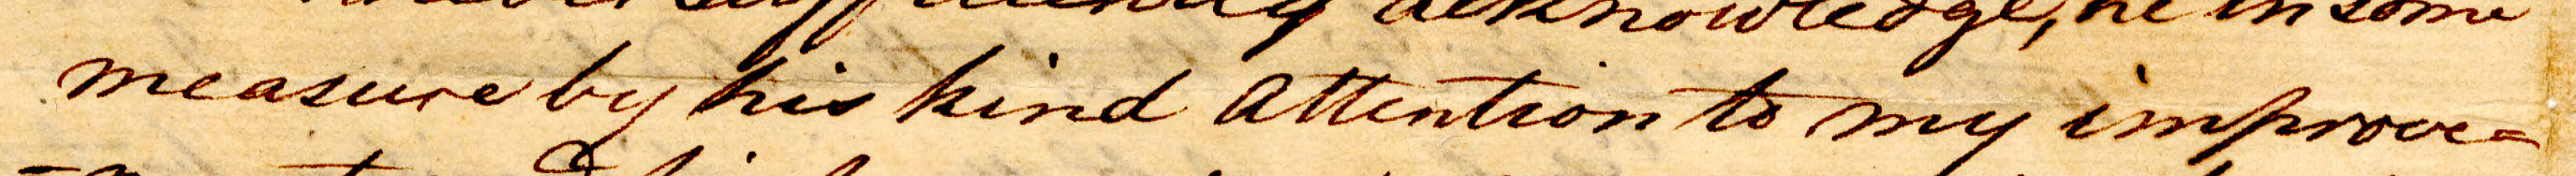measure by his kind Attention to my improve-
